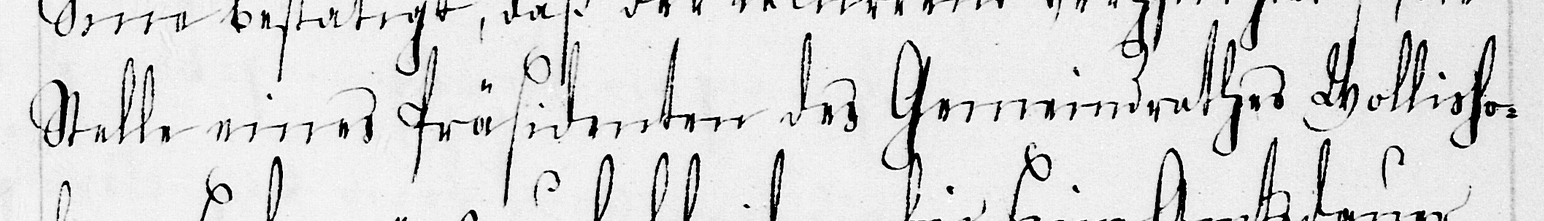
Stelle eines Präsidenten des Gemeindrathes Wollisho¬
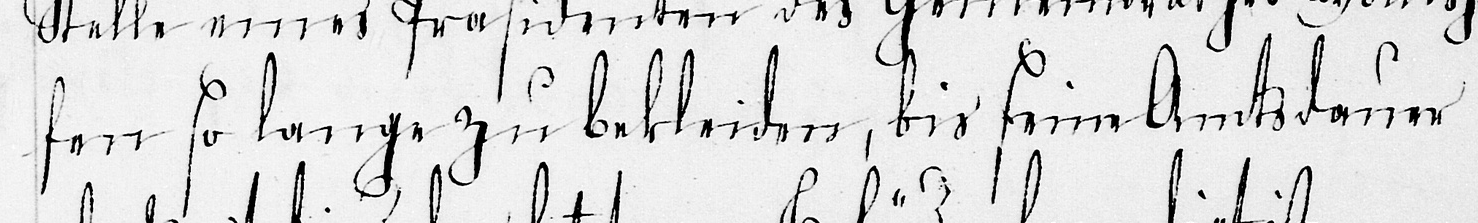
fen so lange zu bekleiden, bis seine Amtsdauer
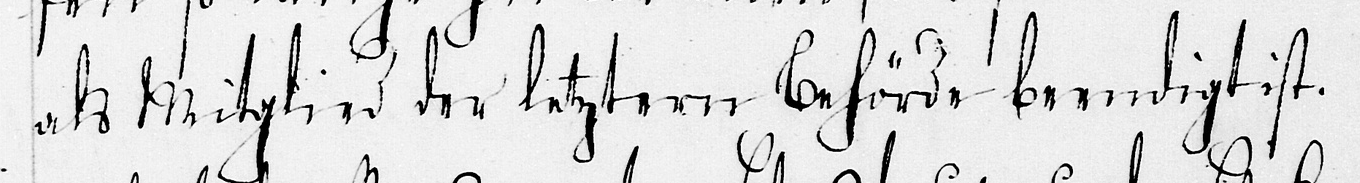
als Mitglied der letztern Behörde beendigt ist.
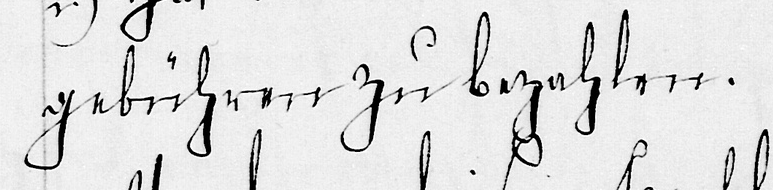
gebühren zu bezahlen.
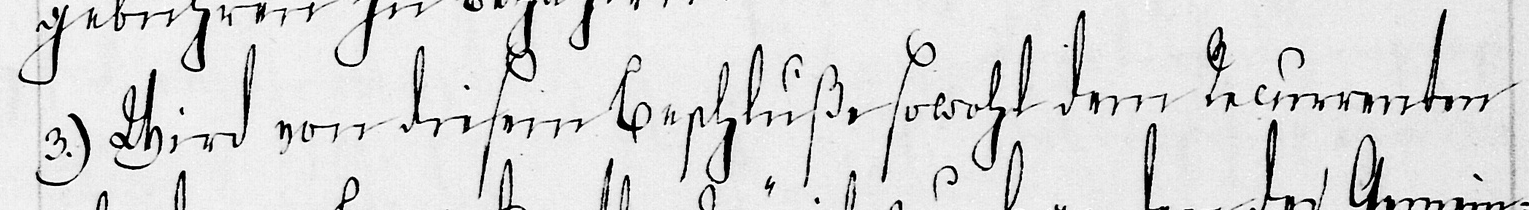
3.) Wird von diesem Beschluße sowohl dem Recurrenten
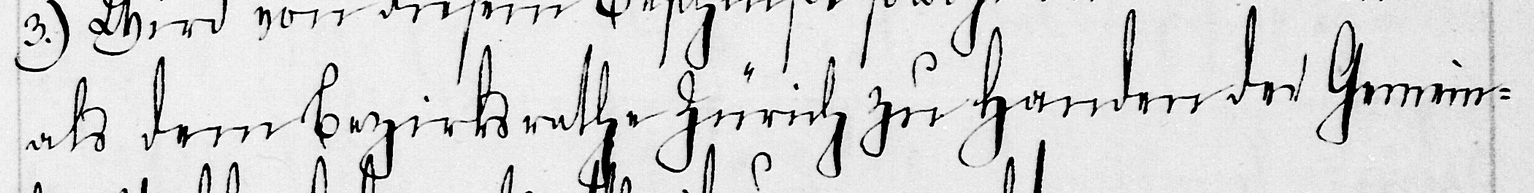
als dem Bezirksrathe Zürich zu Handen der Gemein¬
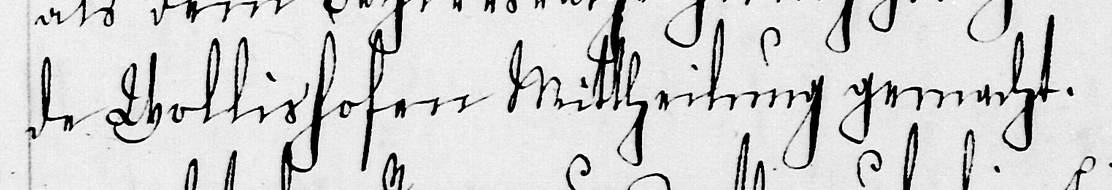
de Wollishofen Mittheilung gemacht.
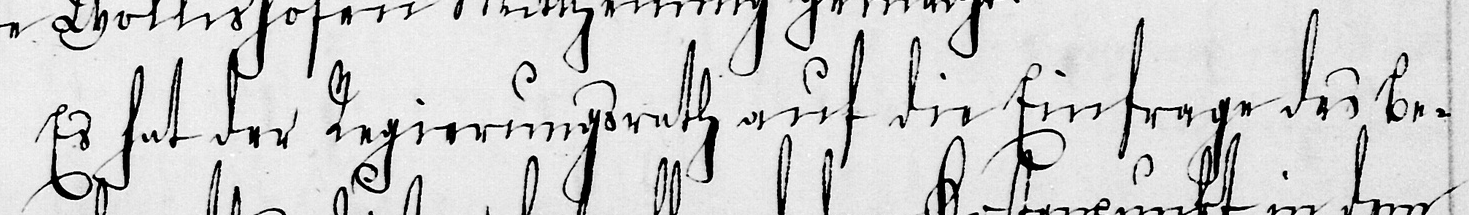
Es hat der Regierungsrath auf die Einfrage des Be¬
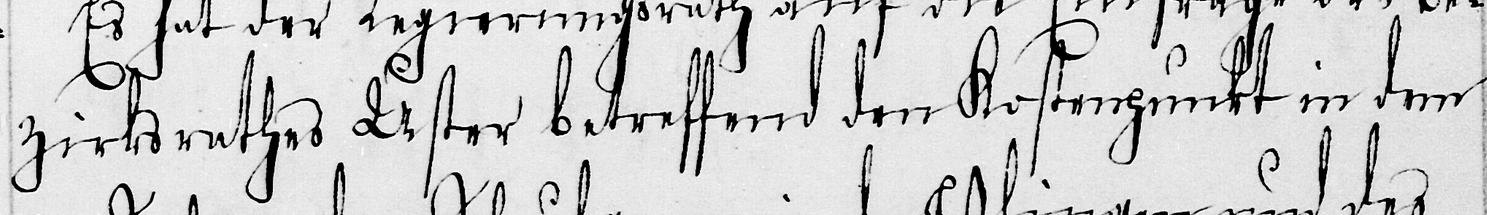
zirksrathes Uster betreffend den Kostenpunkt in de¬
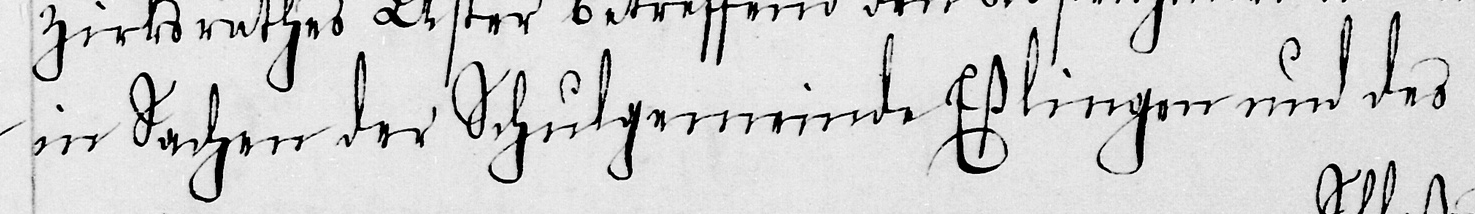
n Sachen der Schulgemeinde Eßlingen und des
